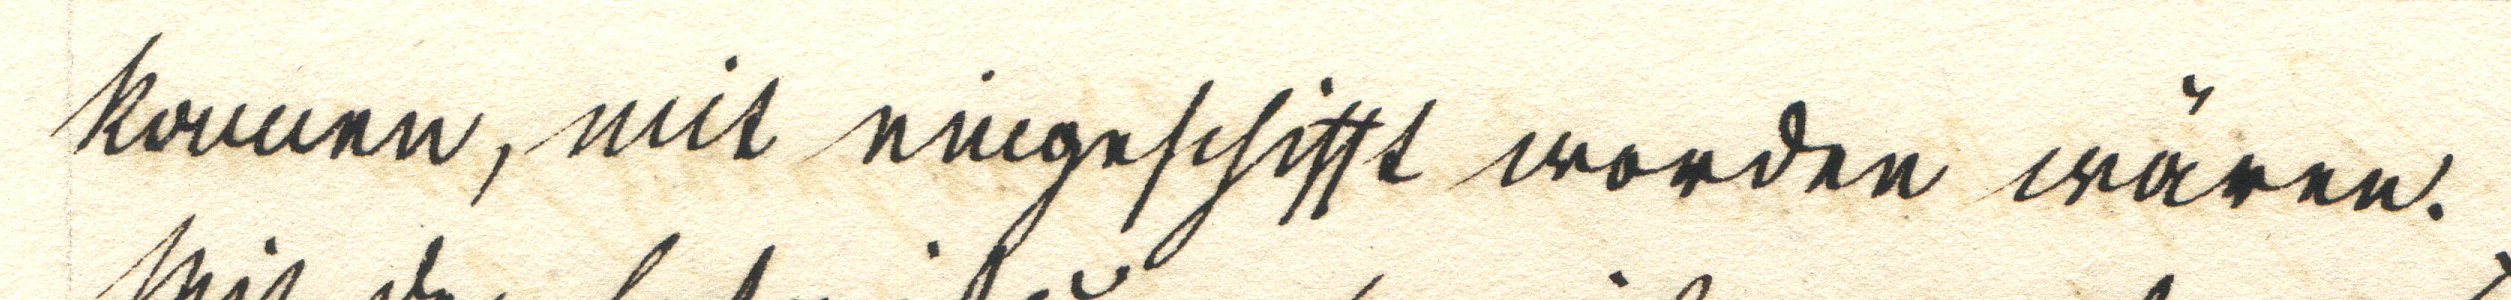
kamen, mit eingeschifft worden wären.
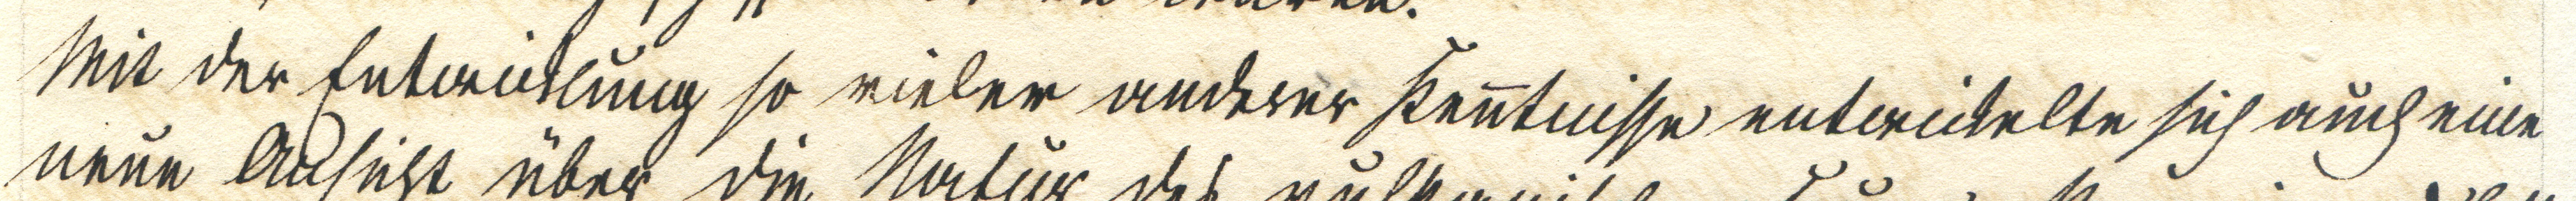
Mit der Entwickelung so vieler anderer Keñtnisse entwickelte sich auch eine
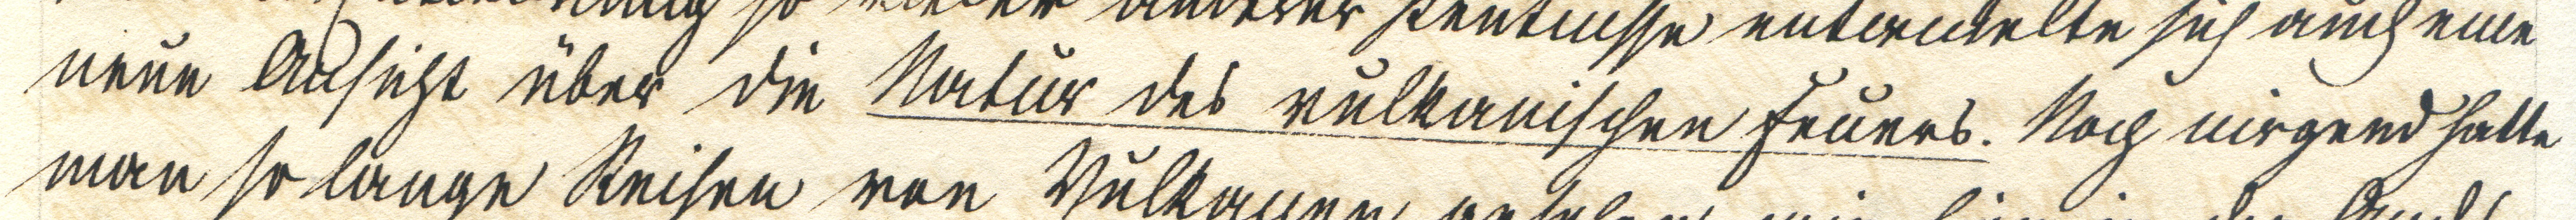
neue Ansicht über die Natur des vulkanischen Feuers. Noch nirgend hatte
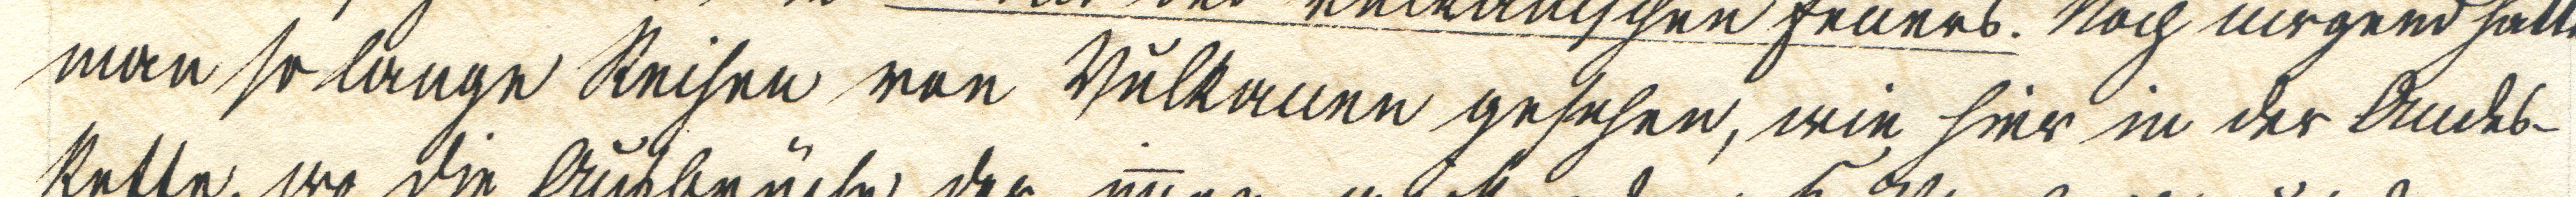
man so lange Reihen von Vulkanen gesehen, wie hier in der Andes-
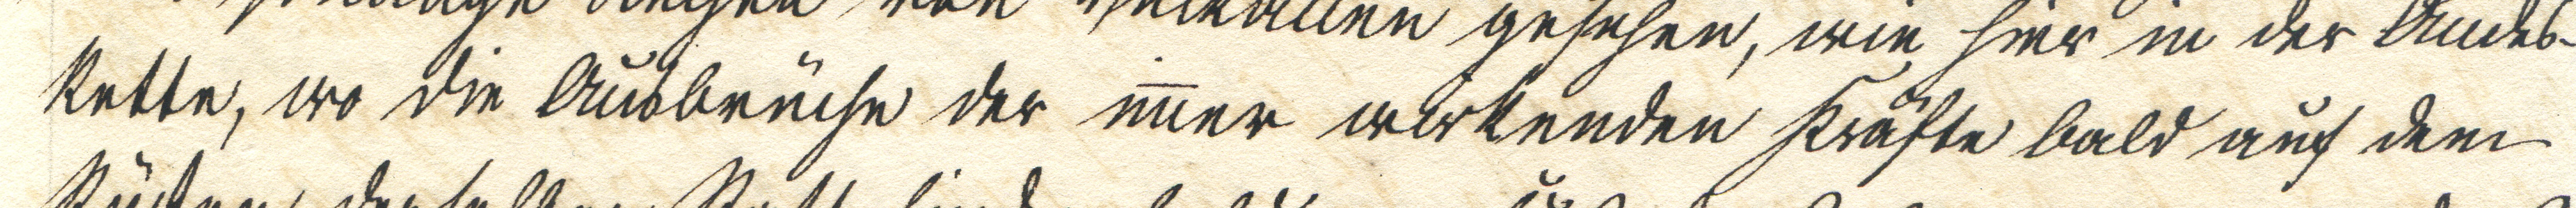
kette, wo die Ausbrüche der im̃er wirkenden Kräfte bald auf dem
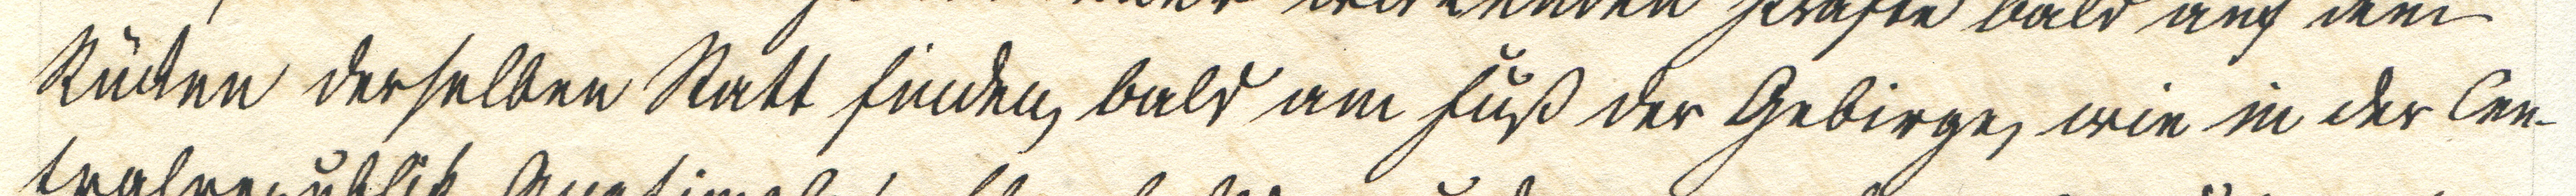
Rücken derselben Statt finden, bald am Fuß der Gebirge, wie in der Cen-
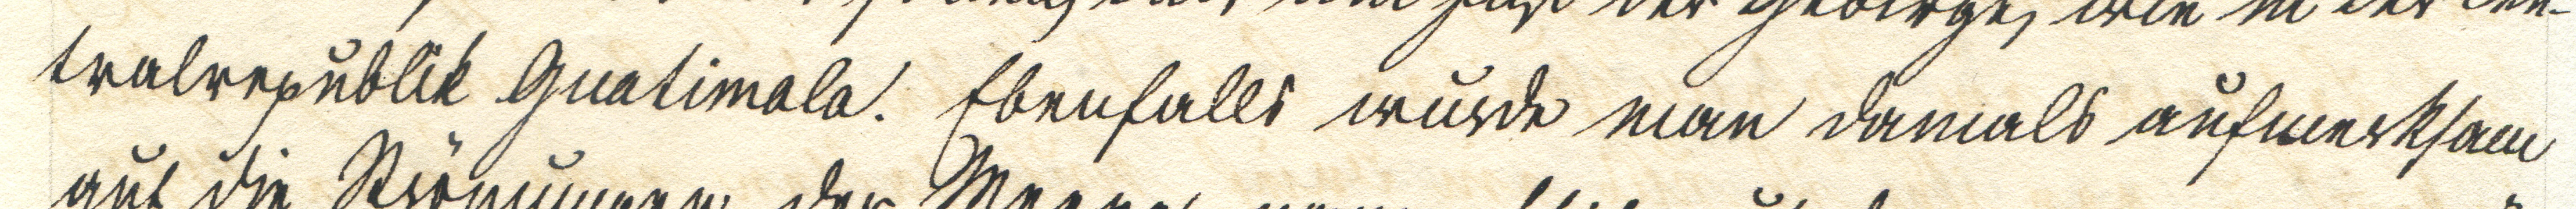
tralrepublik Guatimala. Ebenfalls wurde man damals aufmerksam
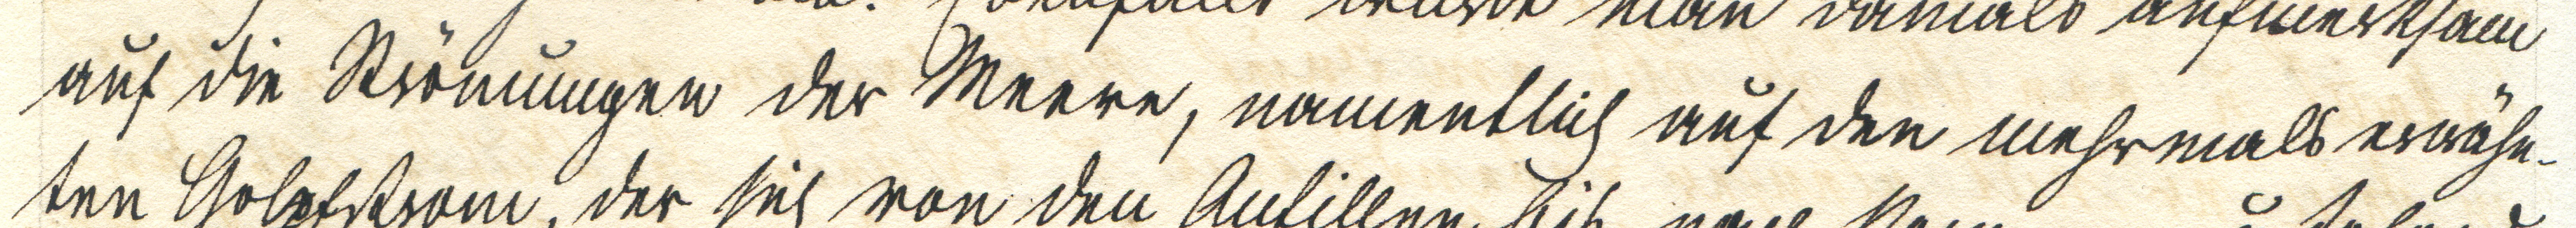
auf die Strömungen der Meere, namentlich auf den mehrmals erwähn-
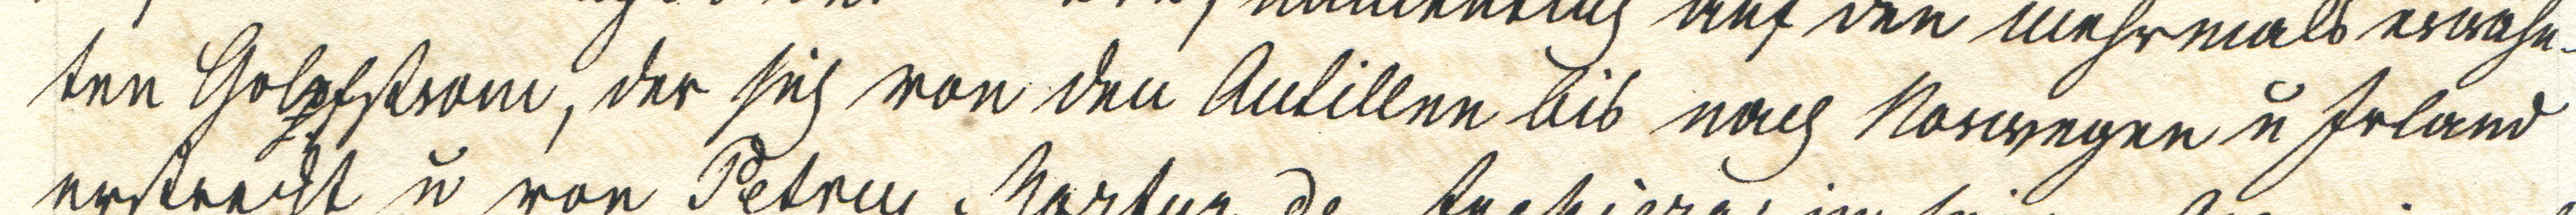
ten Golphfstrom, der sich von den Antillen bis nach Norwegen u Irland
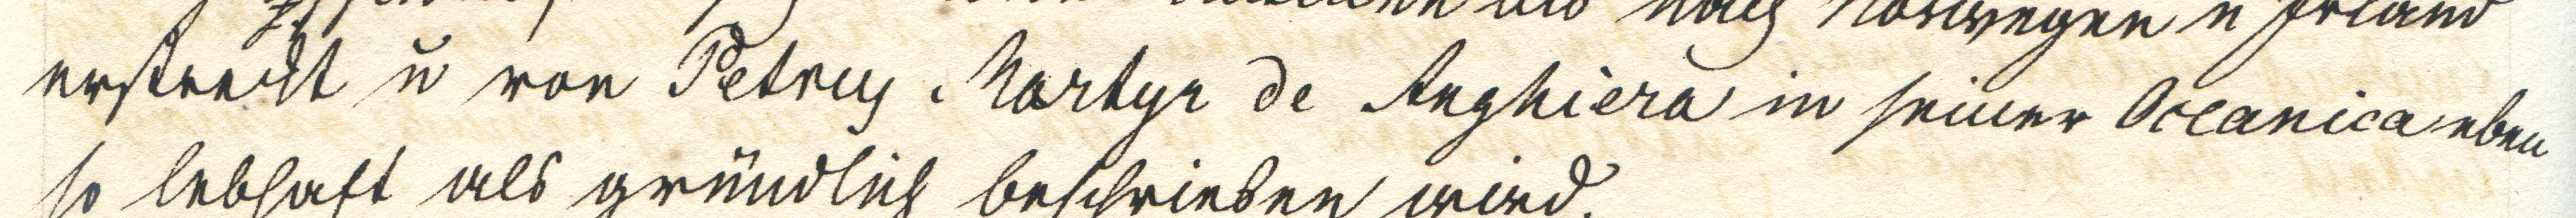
erstreckt u von Petrus Martyr de Anghiera in seiner Oceanica eben
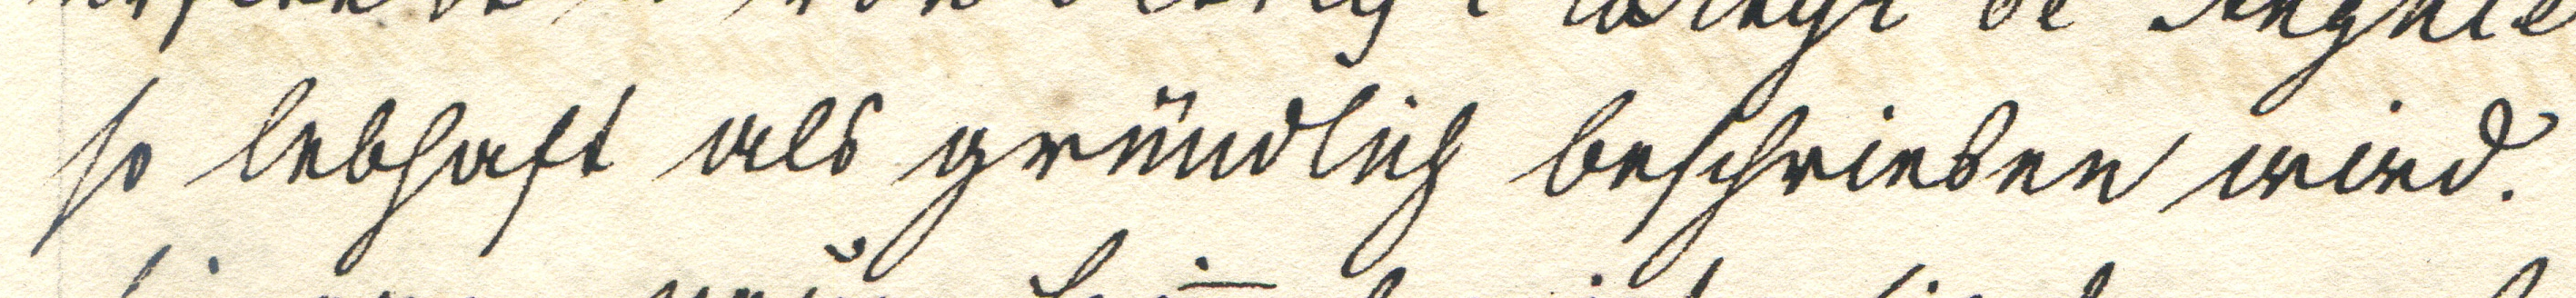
so lebhaft als gründlich beschrieben wird.
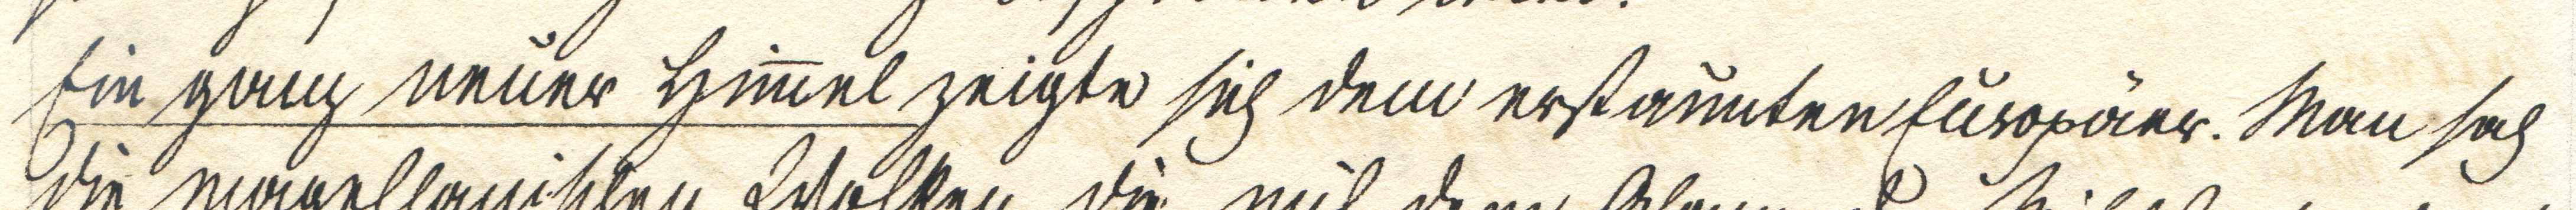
Ein ganz neuer Him̃el zeigte sich dem erstaunten Europäer. Man sah
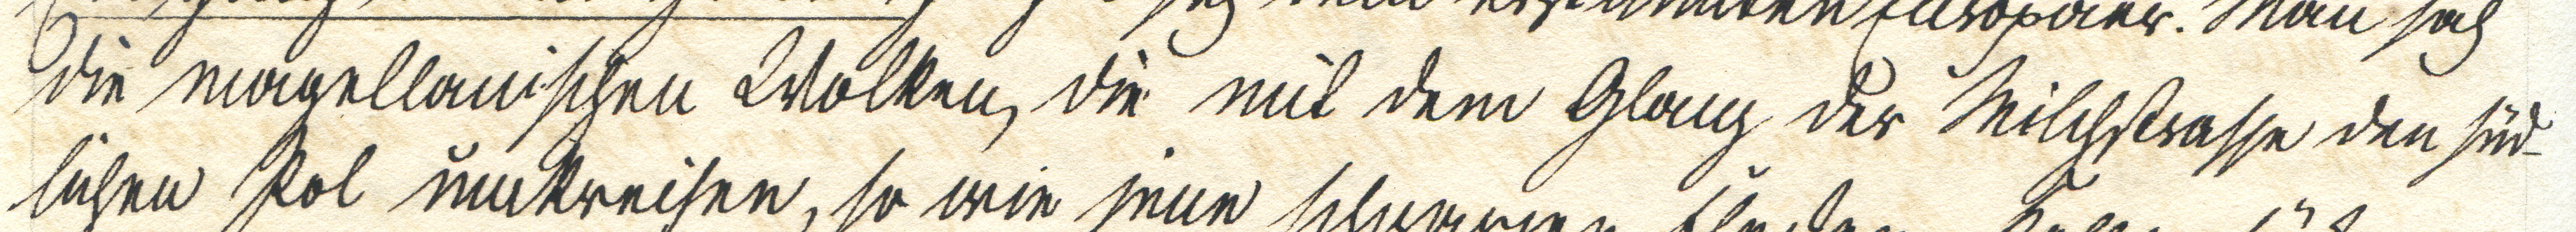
die magellanischen Wolken, die mit dem Glanz der Milchstrasse den süd-
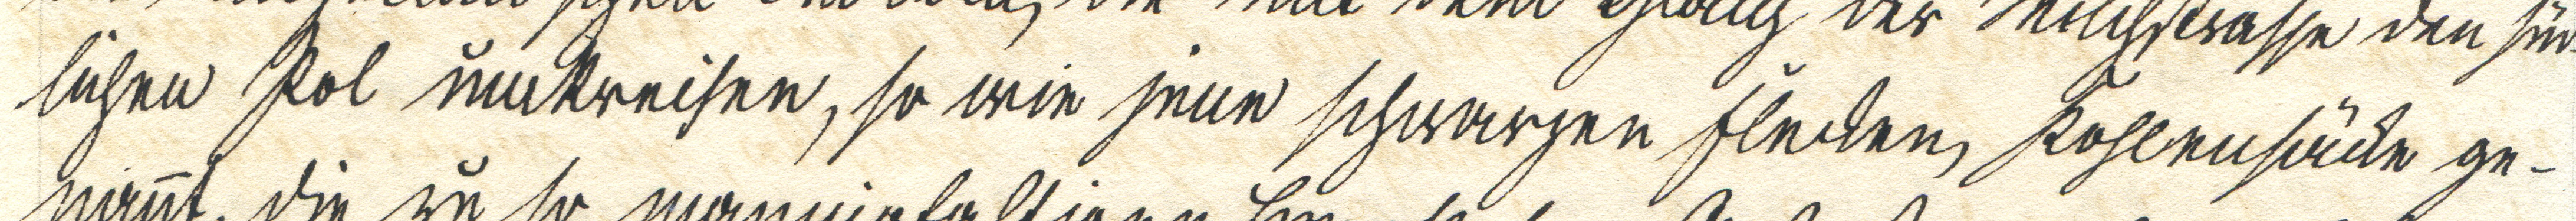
lichen Pol umkreisen, so wie jene schwarzen Flecken, Kohlensäcke, ge-
